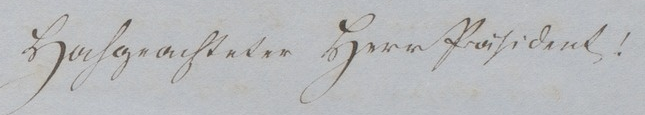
Hochgeachteter Herr Präsident!
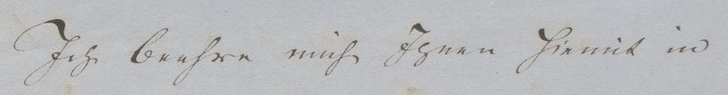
Ich beehre mich Ihnen hiemit in
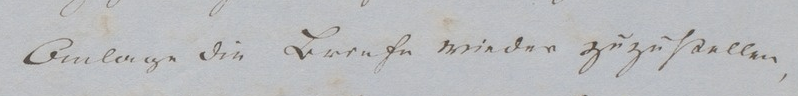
Anlage die Briefe wieder zuzustellen,
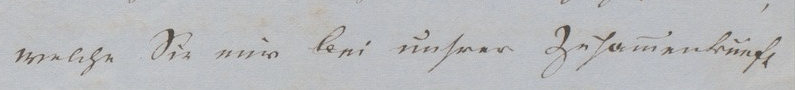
welche Sie mir bei unsrer Zusammenkunft
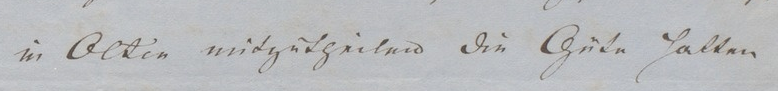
in Olten mitzutheilen die Güte hatten
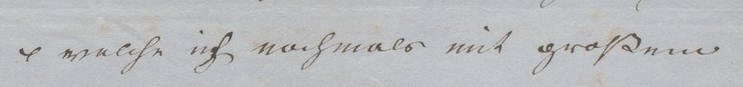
& welche ich nochmals mit großem
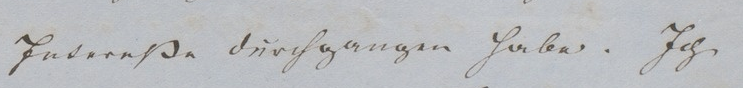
Intereße durchgangen habe. Ich
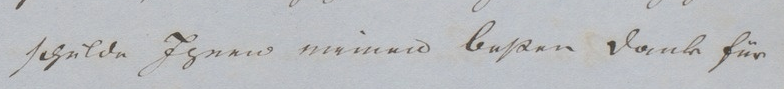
schulde Ihnen meinen besten Dank für
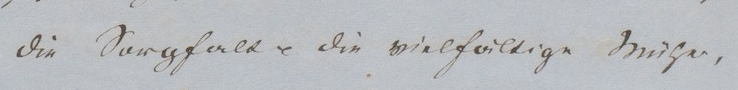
die Sorgfalt & die vielfältige Mühe,
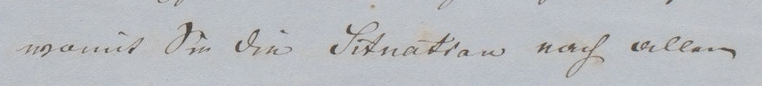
womit Sie die Situation nach allen
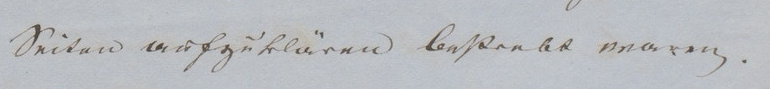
Seiten aufzuklären bestrebt waren.
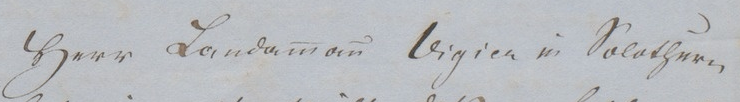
Herr Landammann Vigier in Solothurn
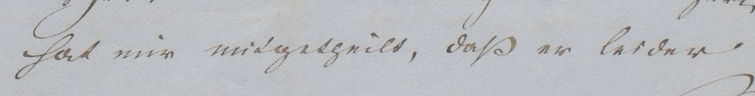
hat mir mitgetheilt, daß er leider
